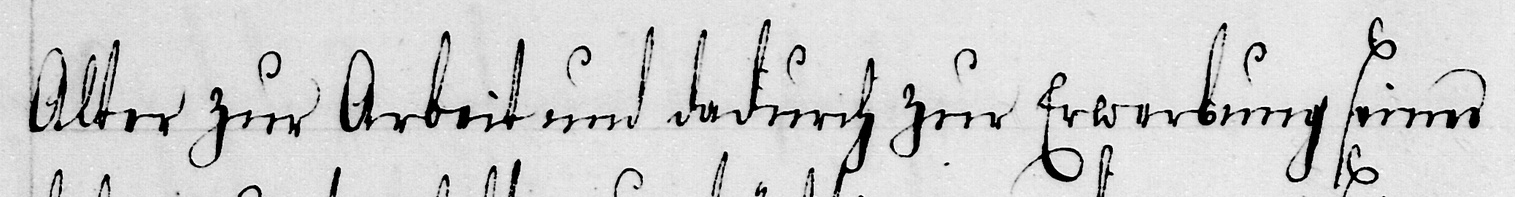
Alter zur Arbeit und dadurch zur Erwerbung seines
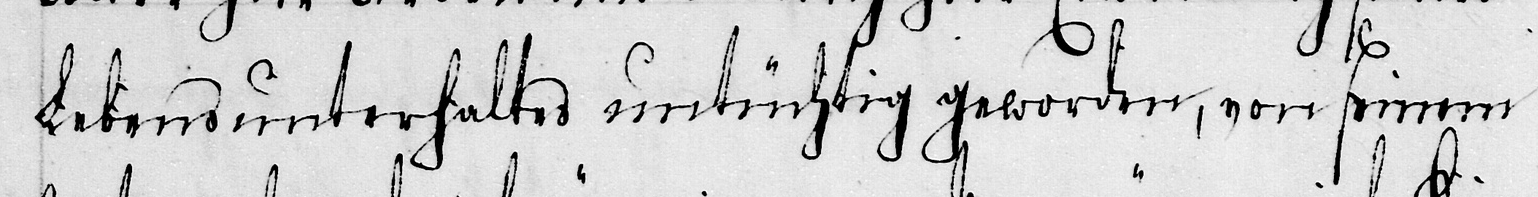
Lebensunterhaltes untüchtig geworden, von seinem
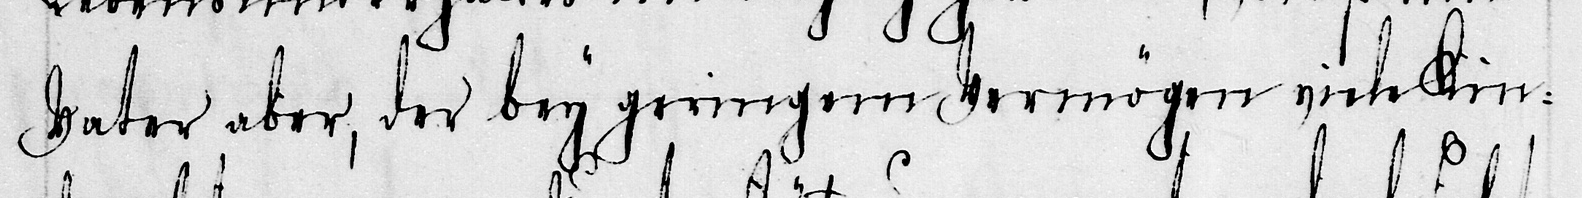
Vater aber, der bey geringem Vermögen viele Kin¬
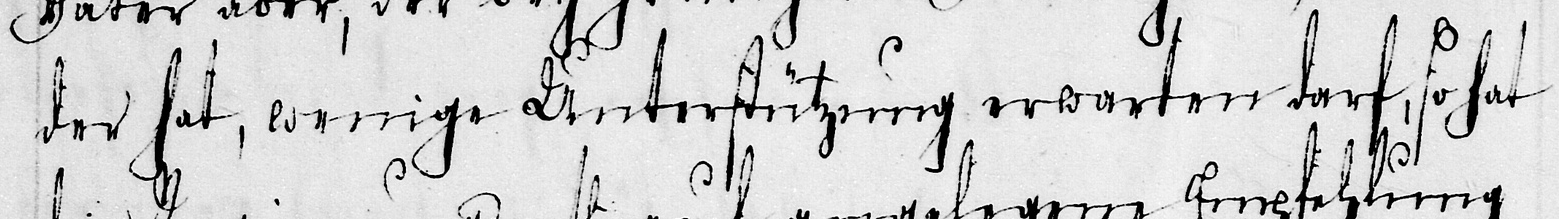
der hat, wenige Unterstützung erwarten darf, so hat
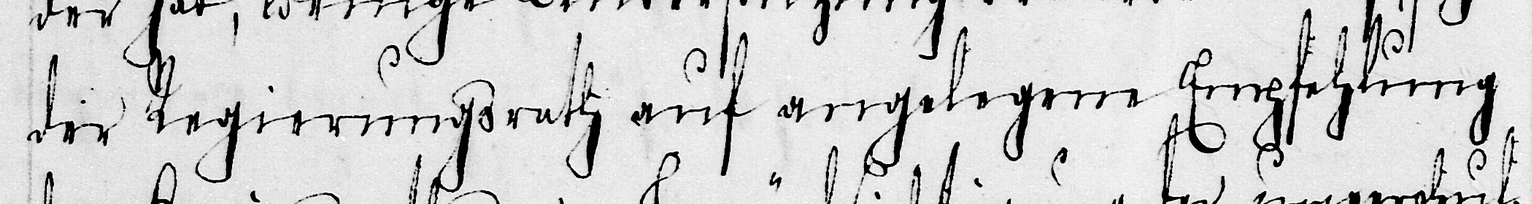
der Regierungsrath auf angelegene Empfehlung
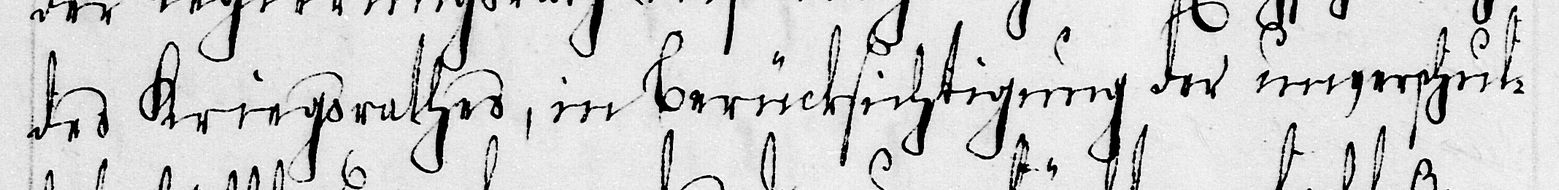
des Kriegsrathes, in Berücksichtigung der unverschul¬
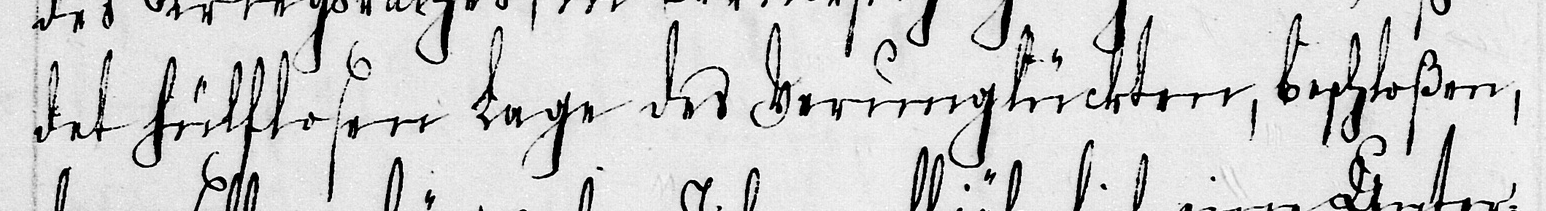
det hülflosen Lage des Verunglückten, beschloßen,
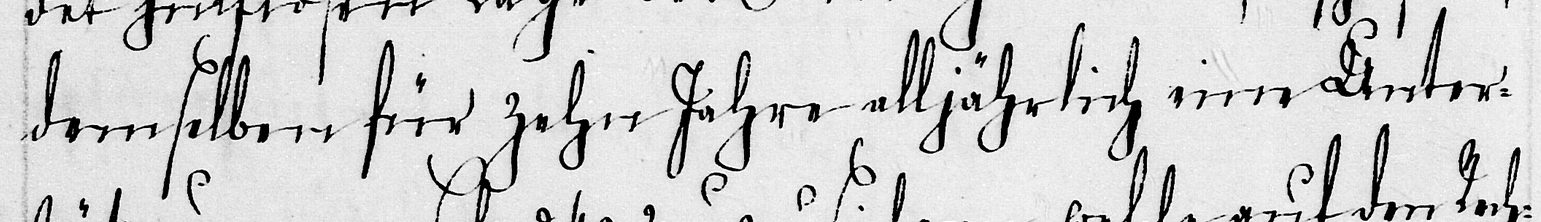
demselben für zehn Jahre alljährlich eine Unter¬
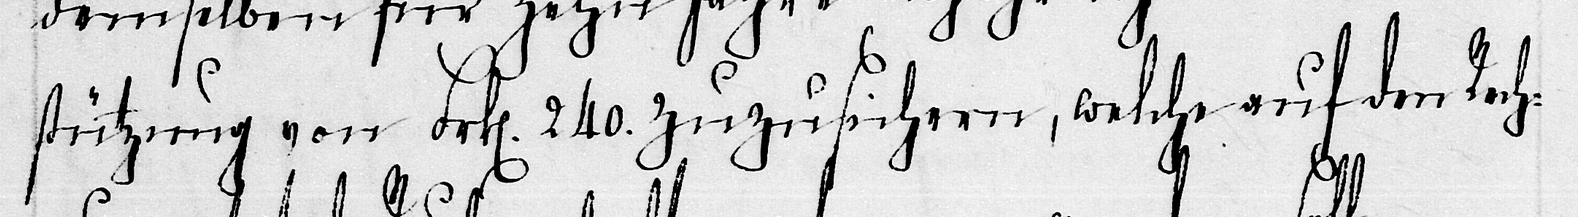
stützung von Frk[en]. 240. zuzusichern, welche auf den Rech¬
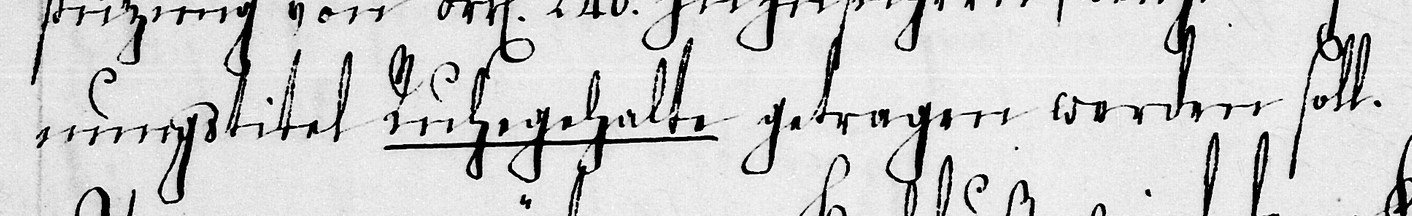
nungstitel Ruhegehalte getragen werden soll.
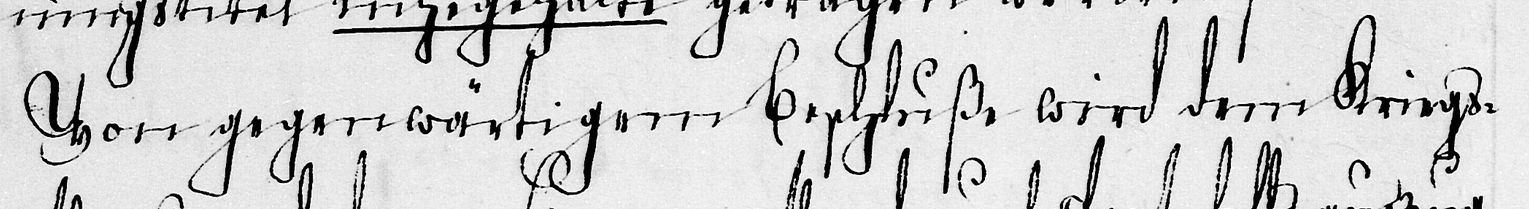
Von gegenwärtigem Beschluße wird dem Kriegs¬
